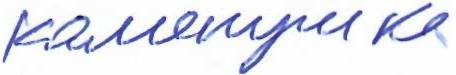каменушка
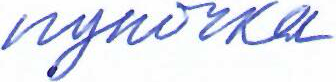пуночка
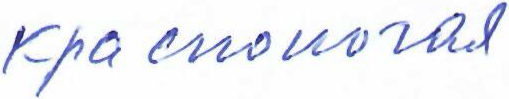красноногая
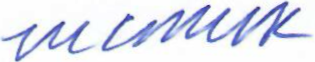чистик
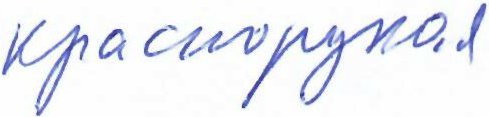краснорукая
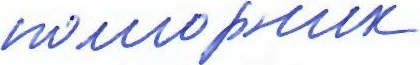поморник
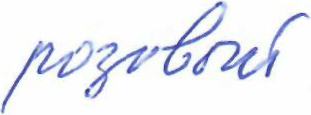розовый
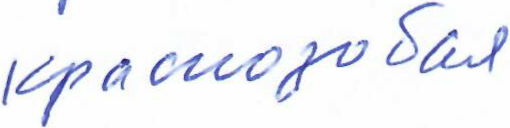краснозобая
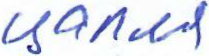цапля
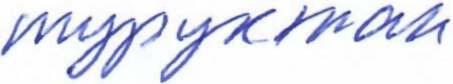турухтан
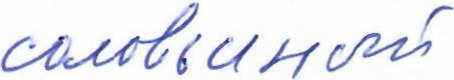соловьиный
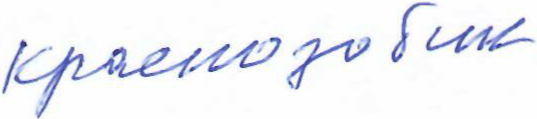краснозобик
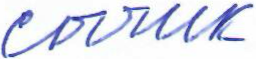сычик
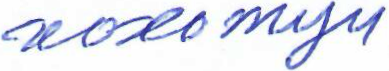хохотун
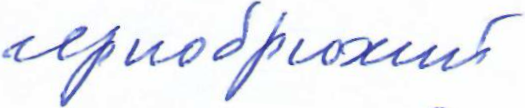чернобрюхий
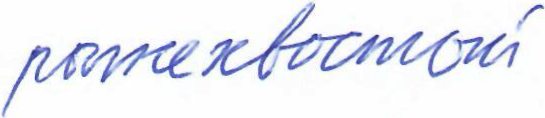рыжехвостый
